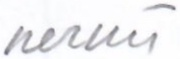пегий
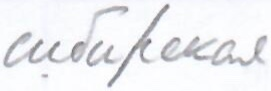сибирская
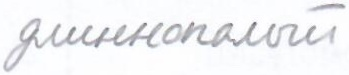длиннопалый
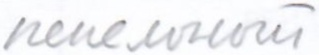пепельный
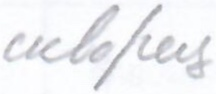скворец
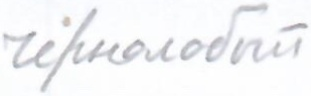чернолобый
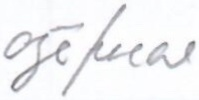озёрная
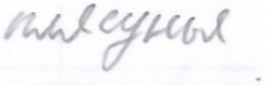плясунья
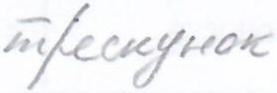трескунок
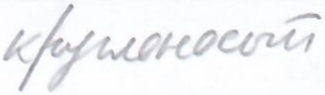круглоносый
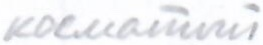косматый
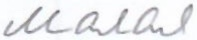малая
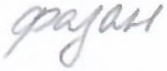фазан
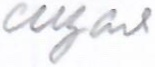сизая
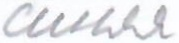синяя
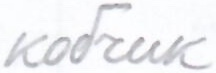кобчик
